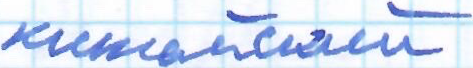китайский
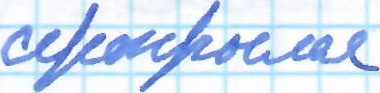серокрылая
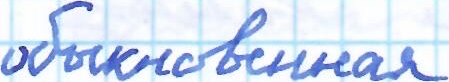обыкновенная
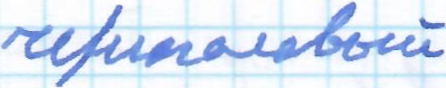черноголовый
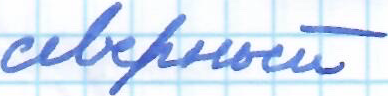северный
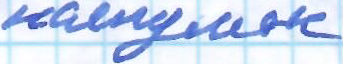пастушок
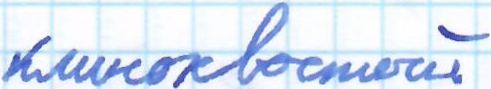клинохвостый
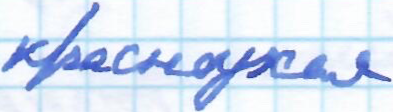красноухая
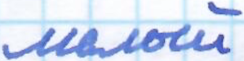малый
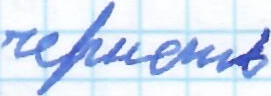чернеть
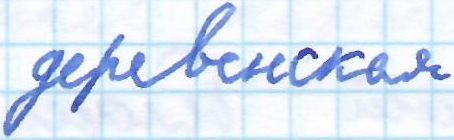деревенская
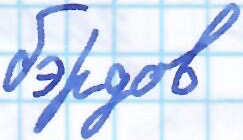бэрдов
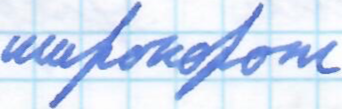широкорот
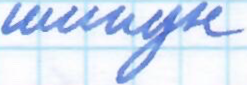шипун
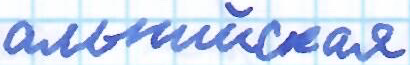альпийская
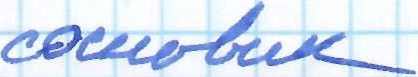сосновик
